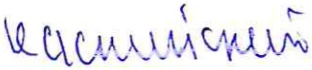каспийский
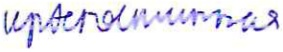кросноспинная
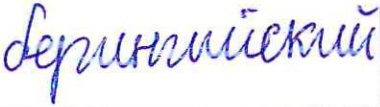берингийский
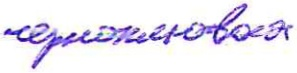черноклювая
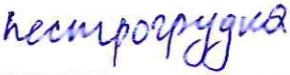пестрогрудка
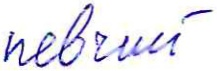певчий
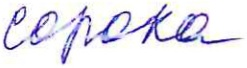сорока
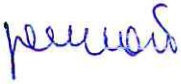речной
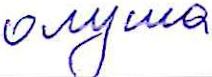олуша
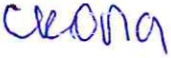скопа
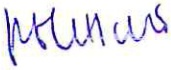рыжий
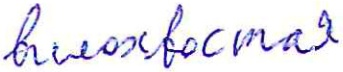вилохвостая
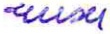чиж
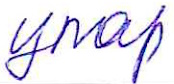улар
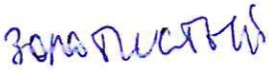золотистый
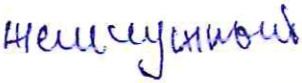жемчужный
